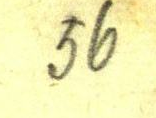56
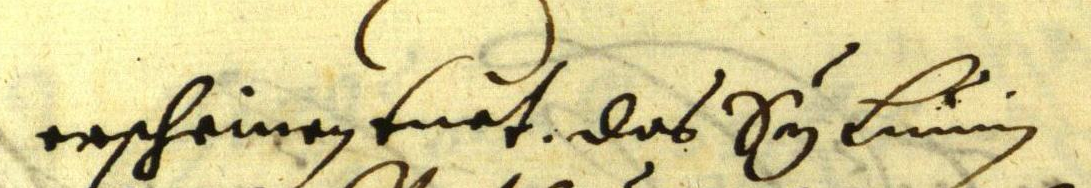erscheinen tūet. das Sȳ Lūnin
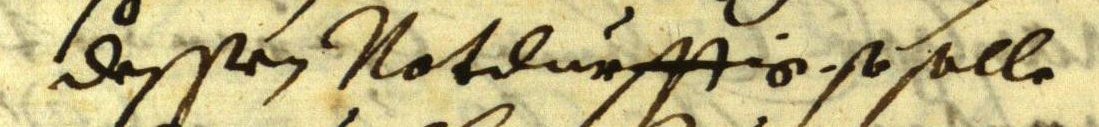dessen Notdūrfftig. so solle
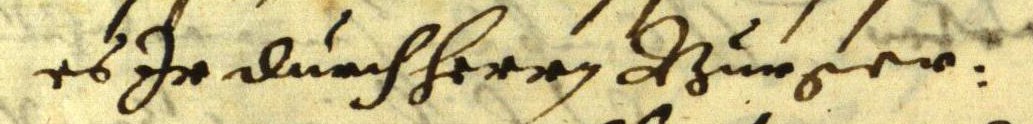es Ir dūrch herrn Būrger¬
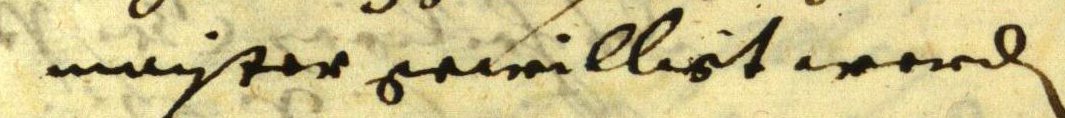maister gewilligt werd
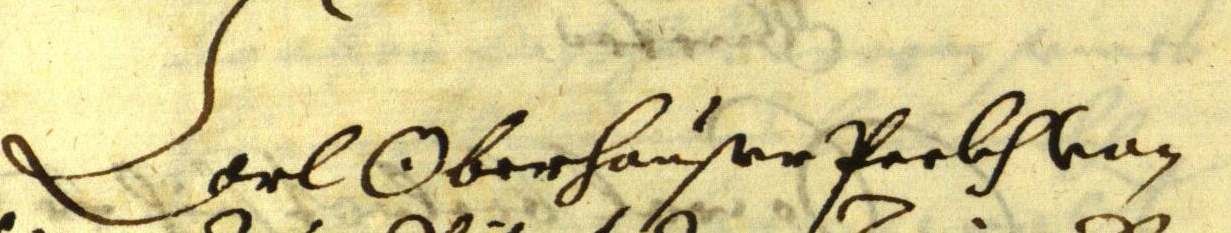Carl Oberhaūser Peckh von
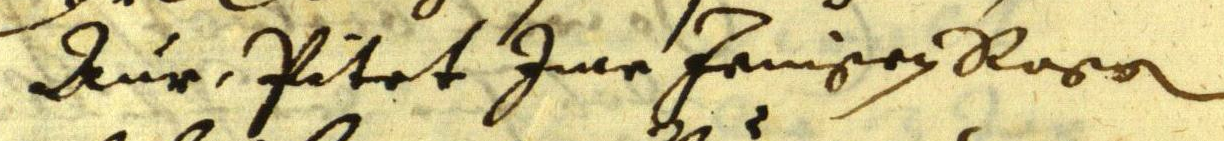Aūr. Pitet Ime Jenigen Rogg
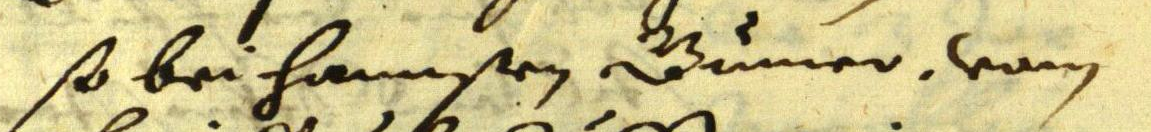so bei hannsen Gūmer. vom
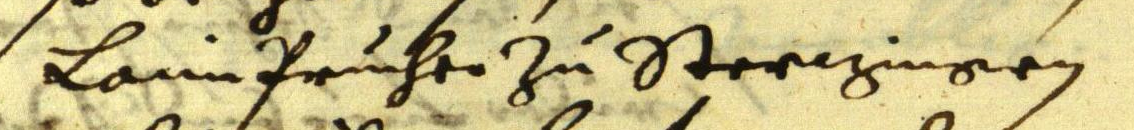Laim Prūcher Zū Sterzingen
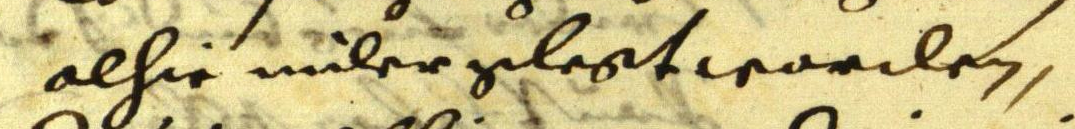alhie nider glegt worden,
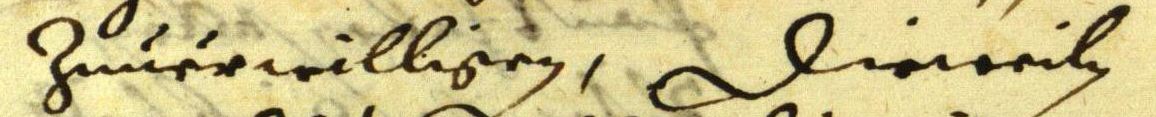Zuūērwilligen, Dieweiln
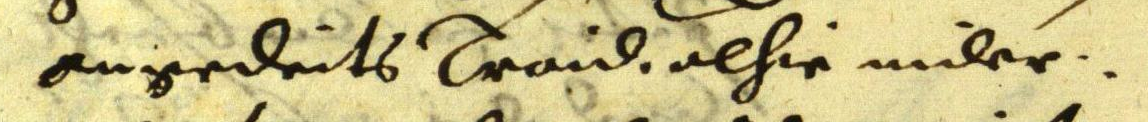angedeits Traid. alhie nider¬
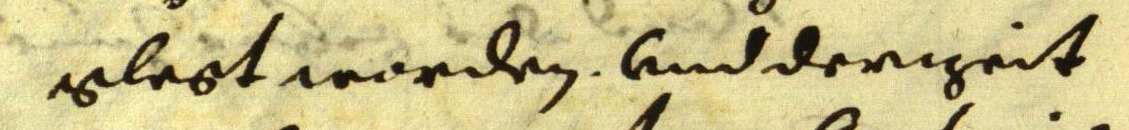glegt worden. vnd derzeit
